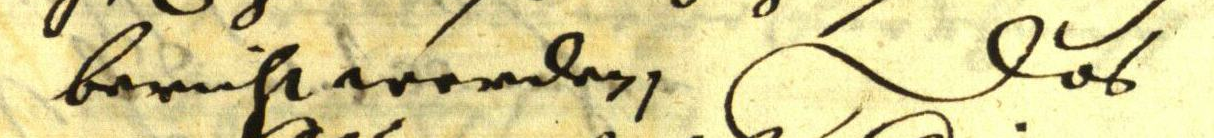bericht werden, Das
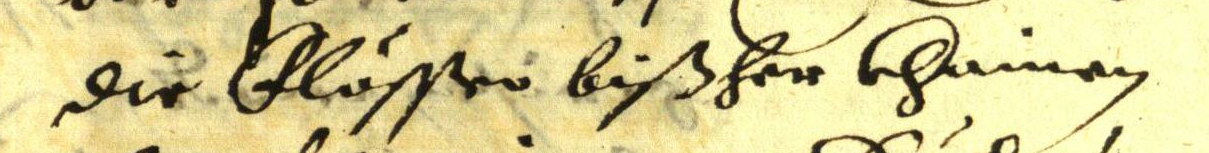die Flōsser bißher khainen
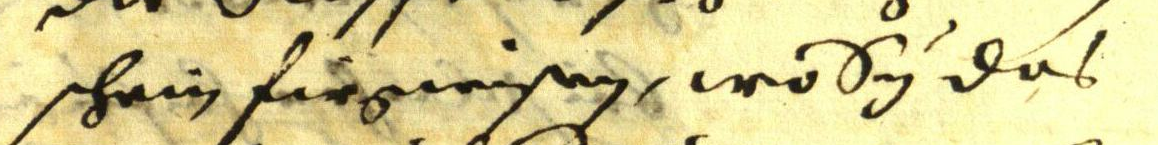schien firgwisen, wo Sȳ das
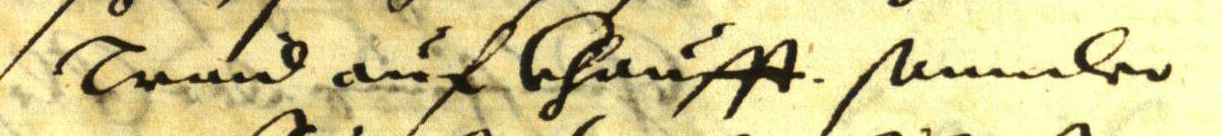Traid aūfkhaūfft. sonnder
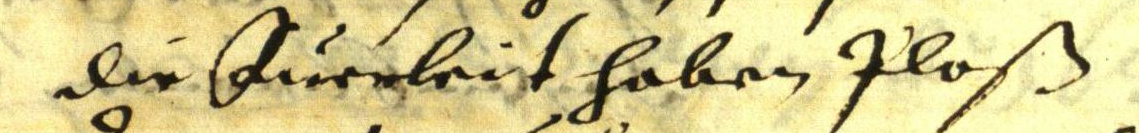die Fūerleit haben Ploß
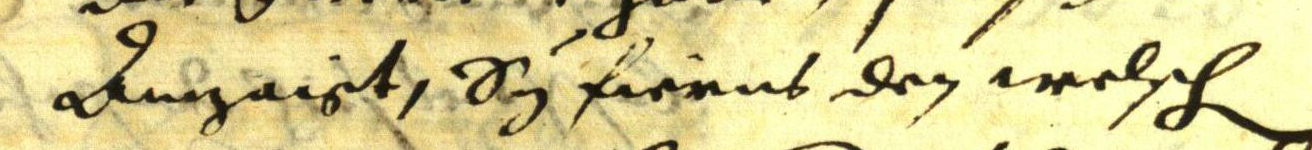Anzaigt, Sȳ fierns den welsch
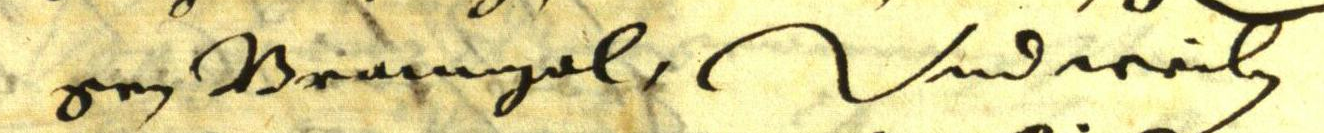gen Brannzol, Vnd weiln
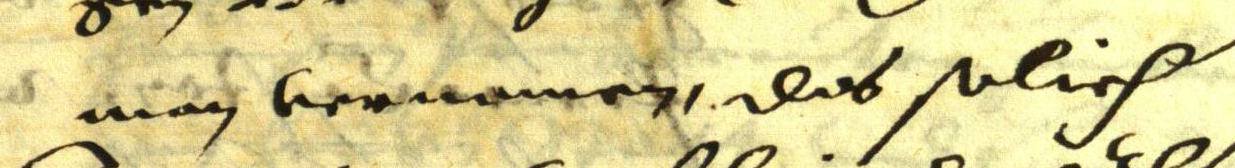man vernomen, das solich
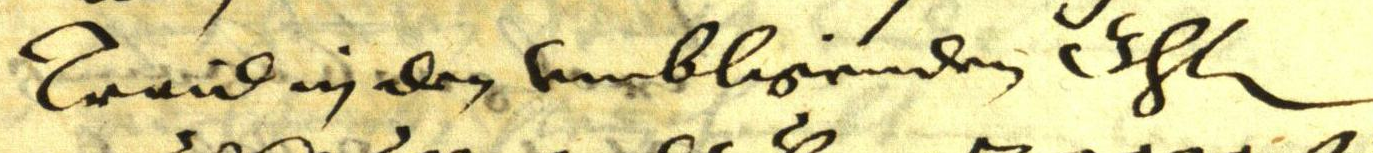Traid in den vmbligenden Ght
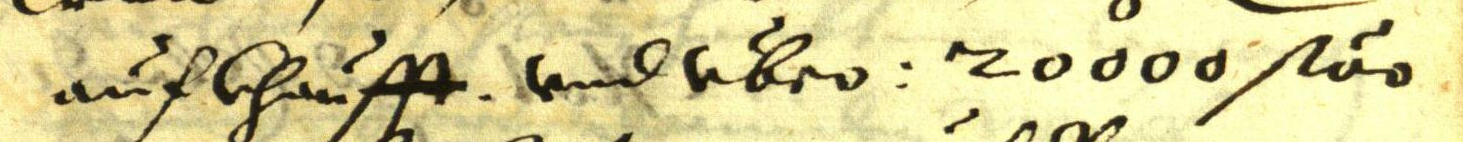aūfkhaūfft. vnd v̄ber 20000 stār
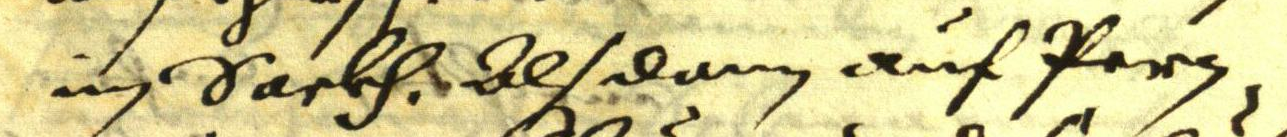im Sackh. Alsdann aūf Pern
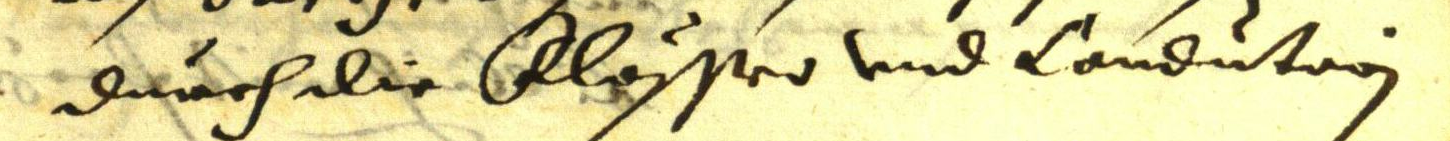dūrch die Flōsser vnd Condūtorj
